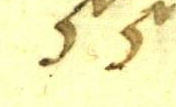55
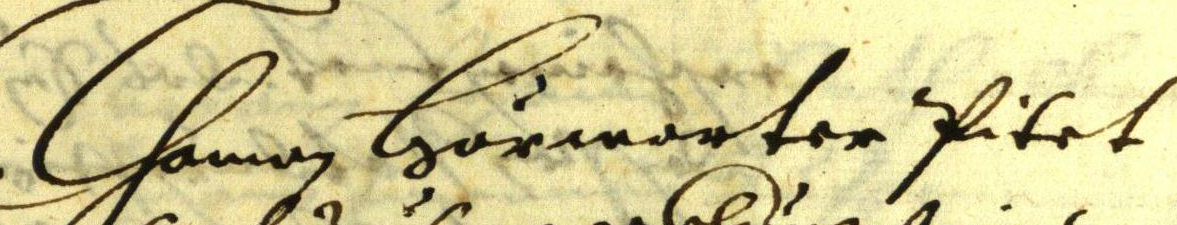Thoman Hōrwarter Pitet
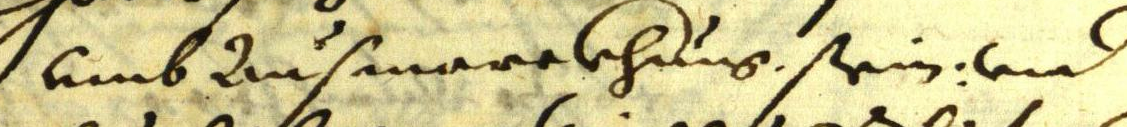vmb Aūsmarckhūng. sein: vnd
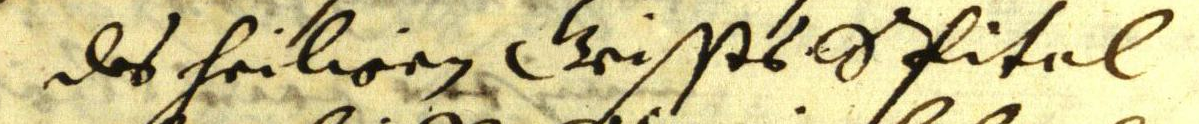des heiligen Geissts Spital
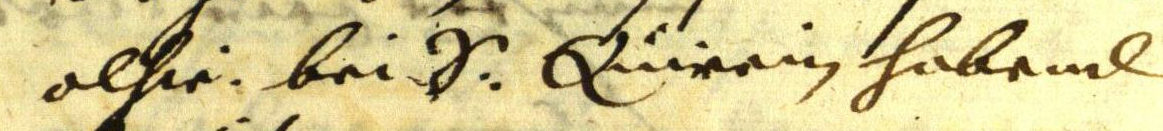alhie. bei S: Qūirein habend
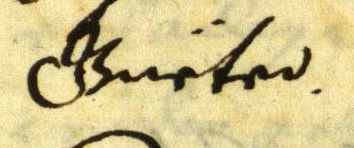Gūeter.
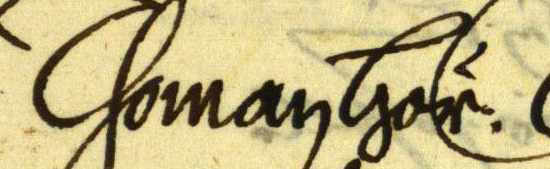Thoman Hōr¬
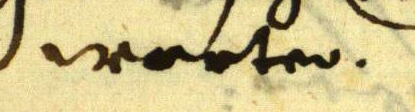warter.
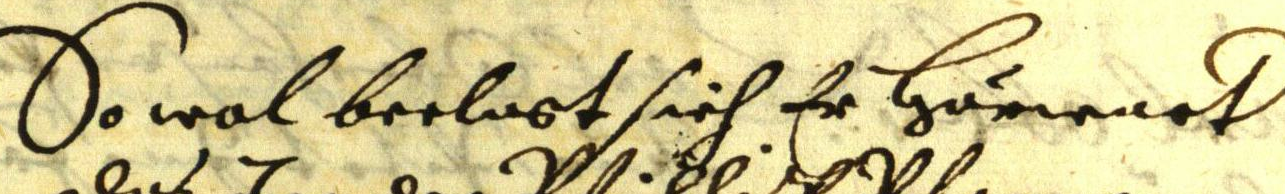So wol beclagt sich Er Hōrwart
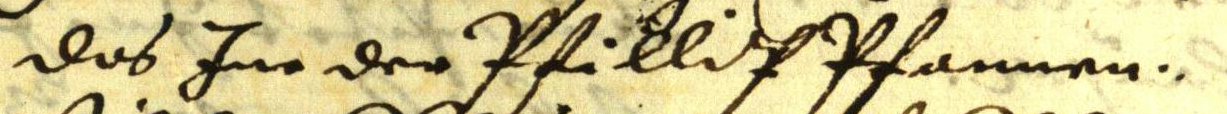das Ine der PfilliP Pfannen¬
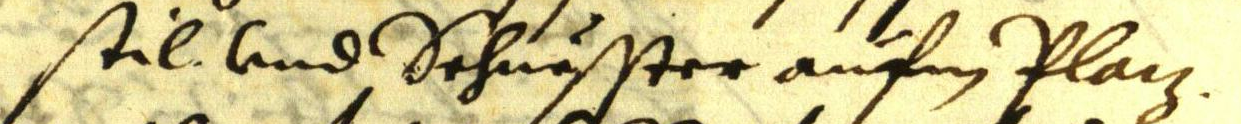stil. vnd Schūesster aūfm Plaz.
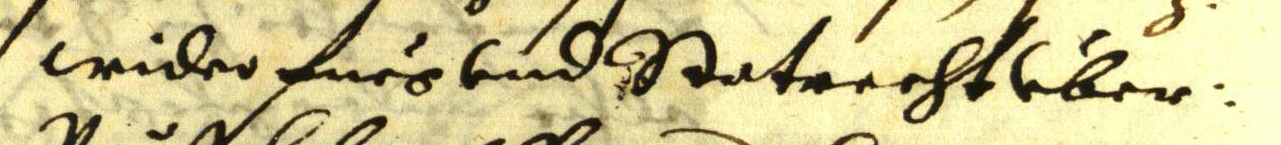wider fūeg vnd Statrecht v̄ber¬
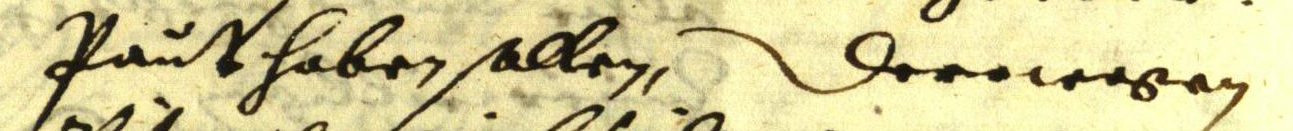Paūt haben sollen, Derowegen
